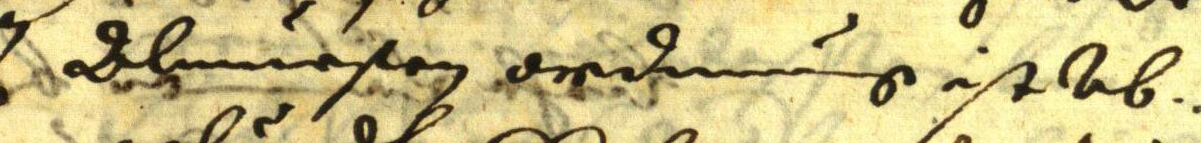Almūesen ordnūng ist Ab¬
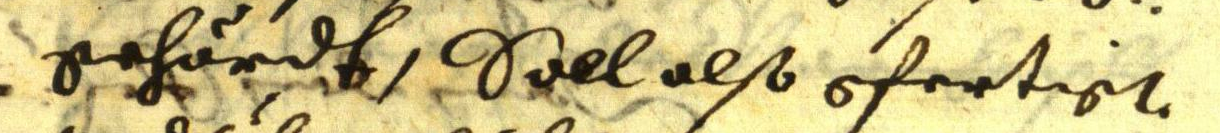gehōrdt, Soll also gfertigt
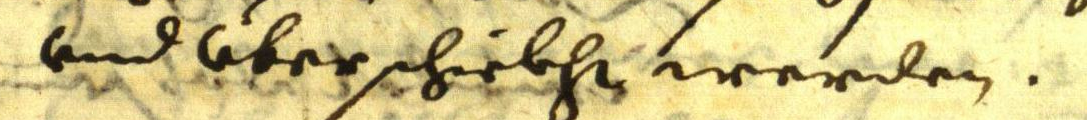vnd v̄berschickht werden.
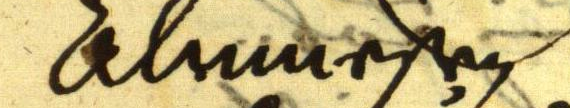Almūesen
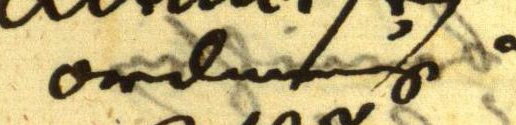ordnūng
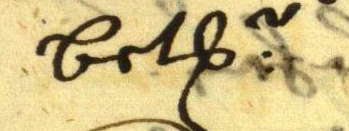bet:
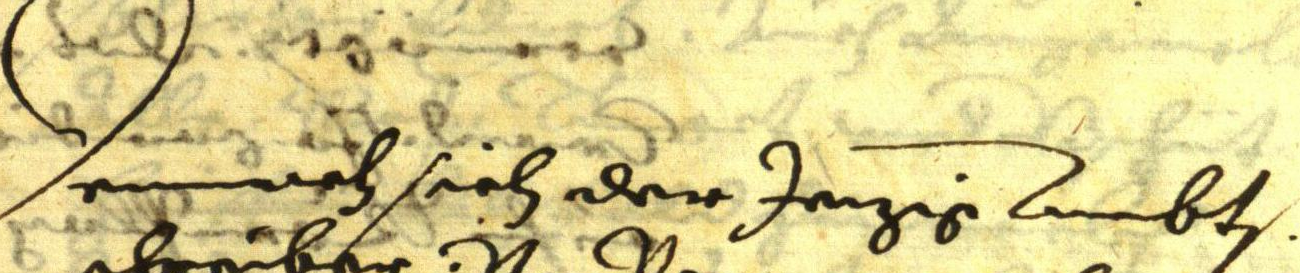Demnach sich der Jezig Ambts¬
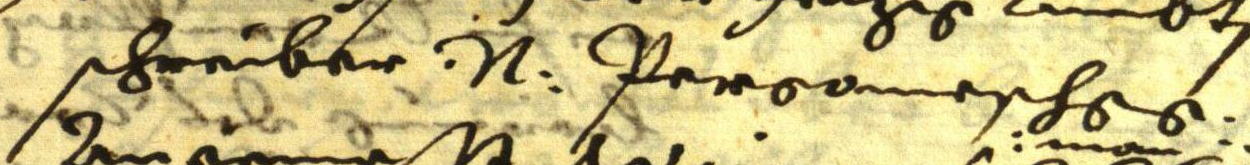schreiber. N: Pergameschgg.
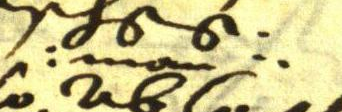:man:
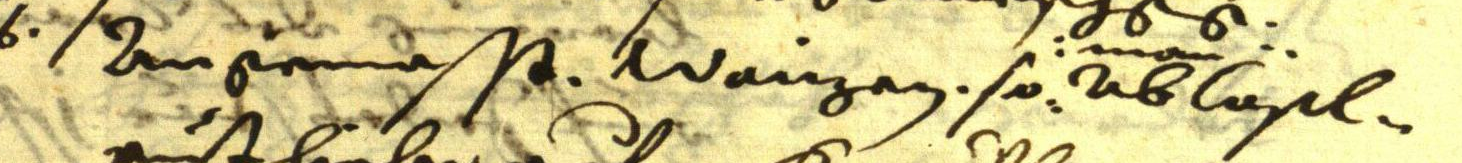Angemasst. Waizen. so: Ab Castl¬
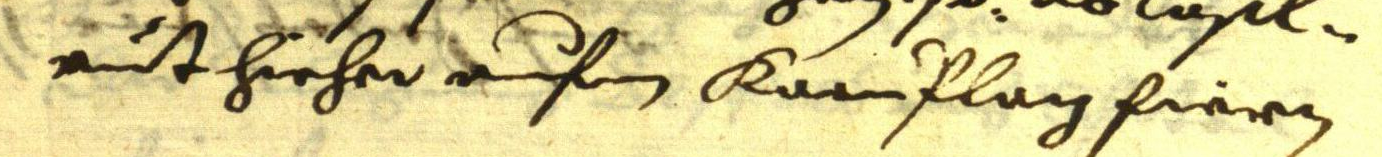rūt hieher aūfm KornPlaz fiern
